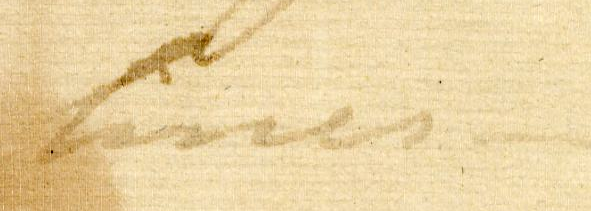lines-
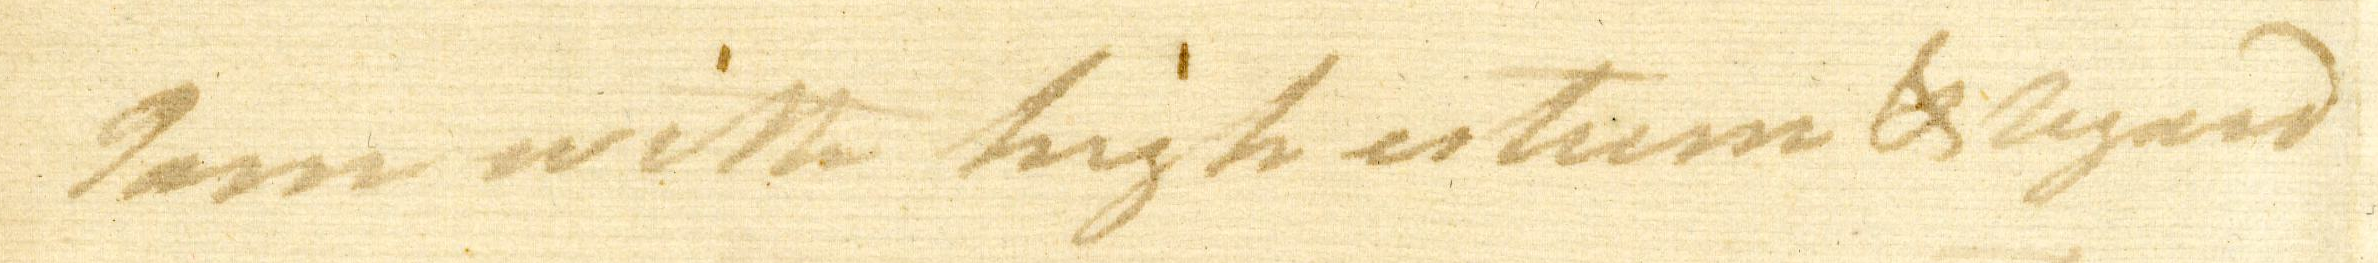I am with high esteem & regard
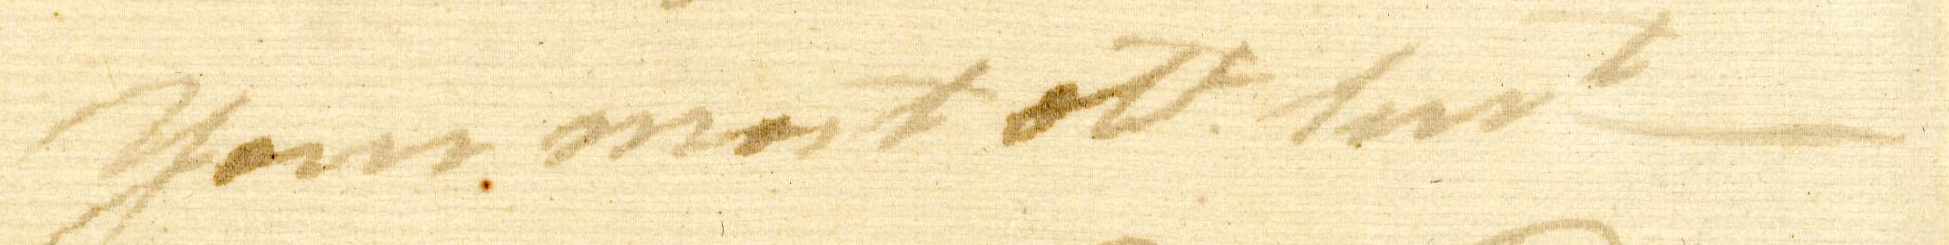Your most ob^t. serv^t-
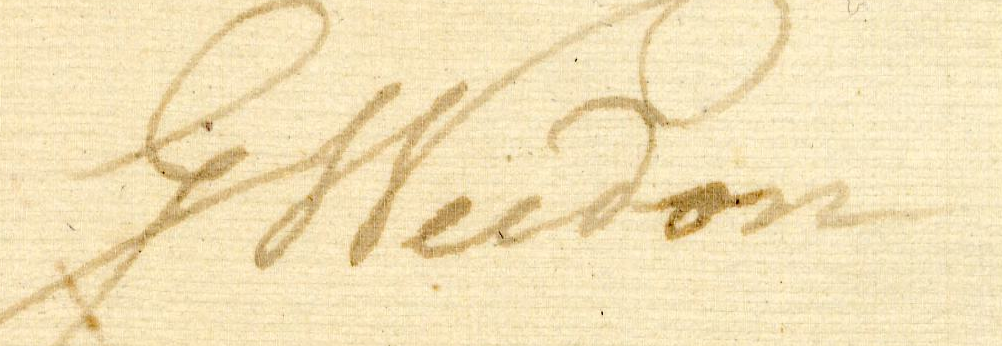G Weedon
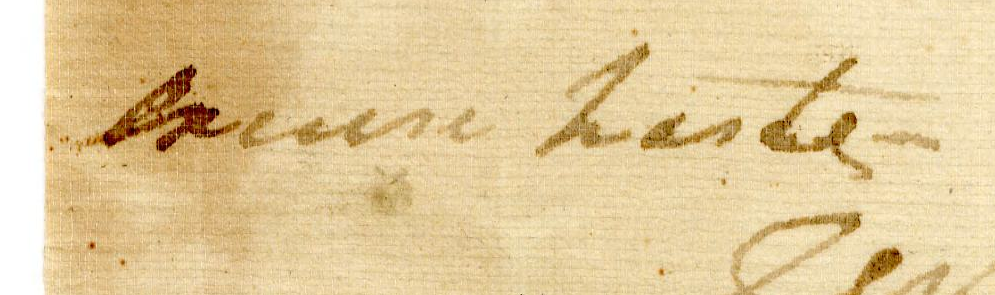excuse haste-
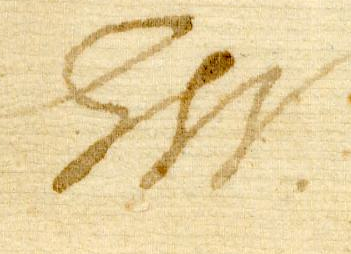GW
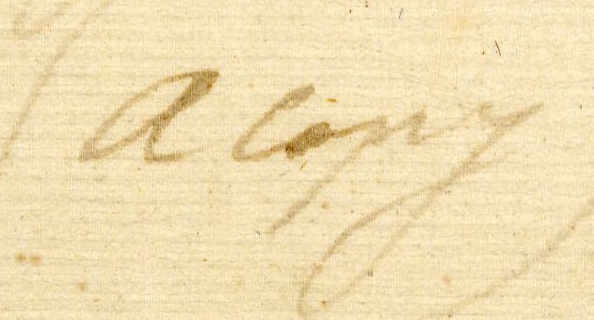a copy
